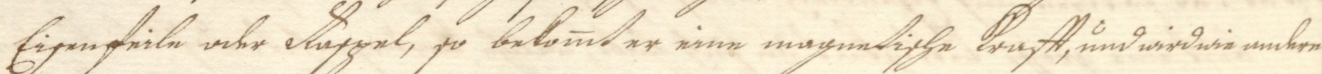Eisenfeile oder Raspel, so bekommt er eine magnetische Krafft, und wird wie andere
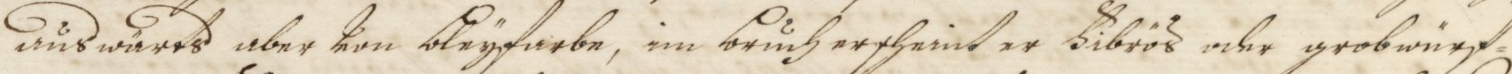auswärts aber von Bleyfarbe, im Bruch erscheint er Fibrös oder grobwürf-
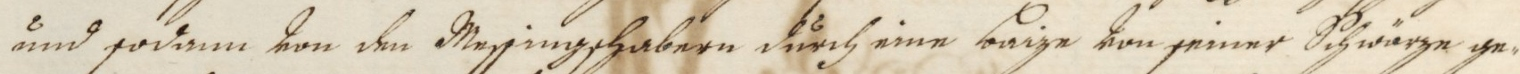und sodann von den Messingshabern durch eine Baize von seiner Schwärze ge-
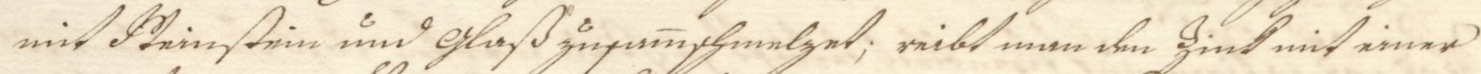mit Weinstein und Glaß zusammschmelzet; reibt man den Zink mit einer
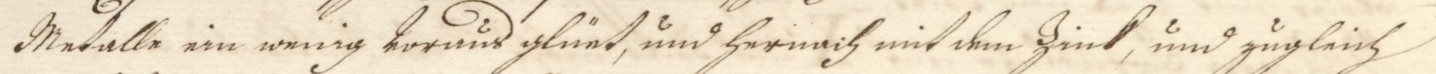Metalle ein wenig voraus glüet, und hernach mit dem Zink, und zugleich
